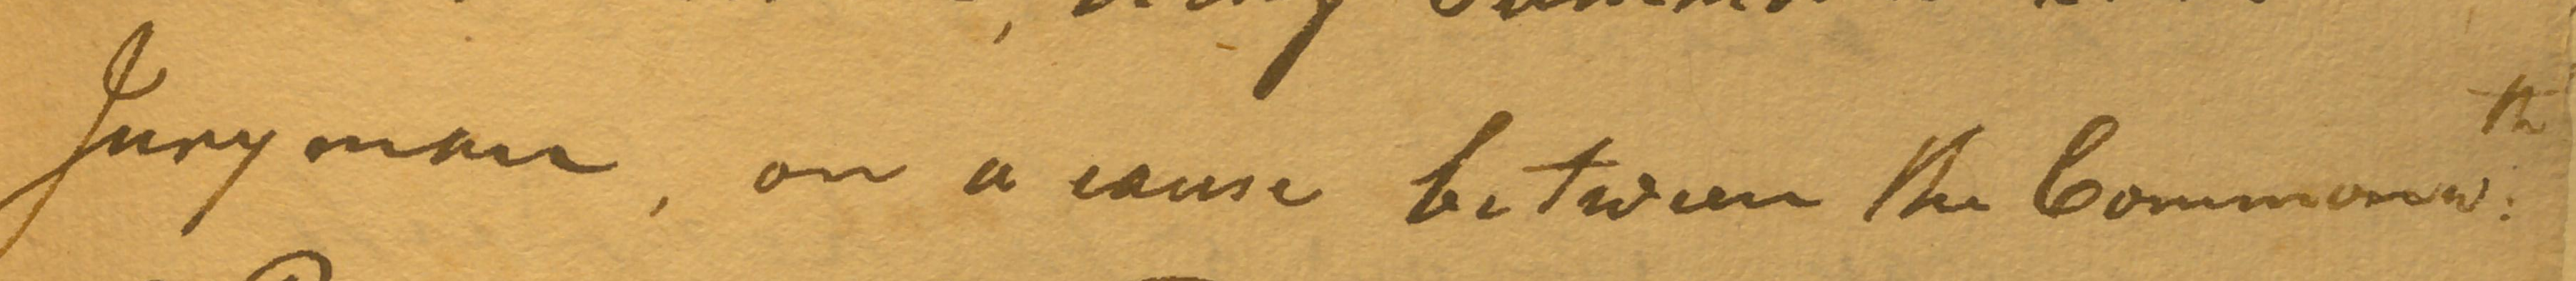Jury man, on a cause between the Commonw^th:
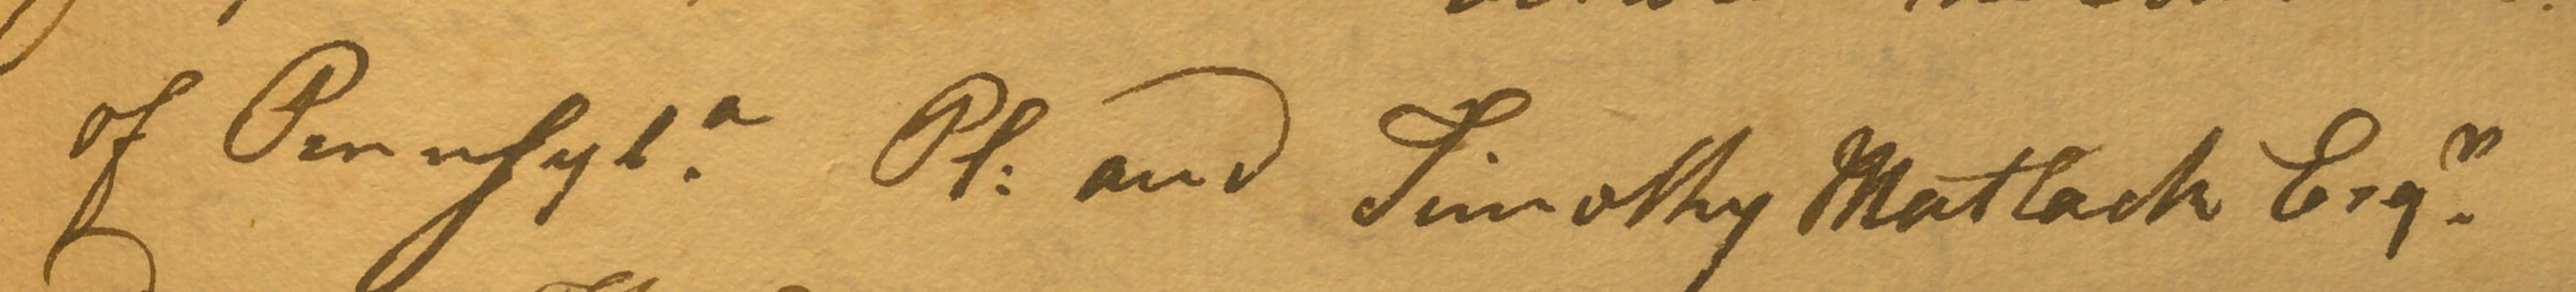of Pennsyl^a. Pl: and Timothy Matlack Esq^r.
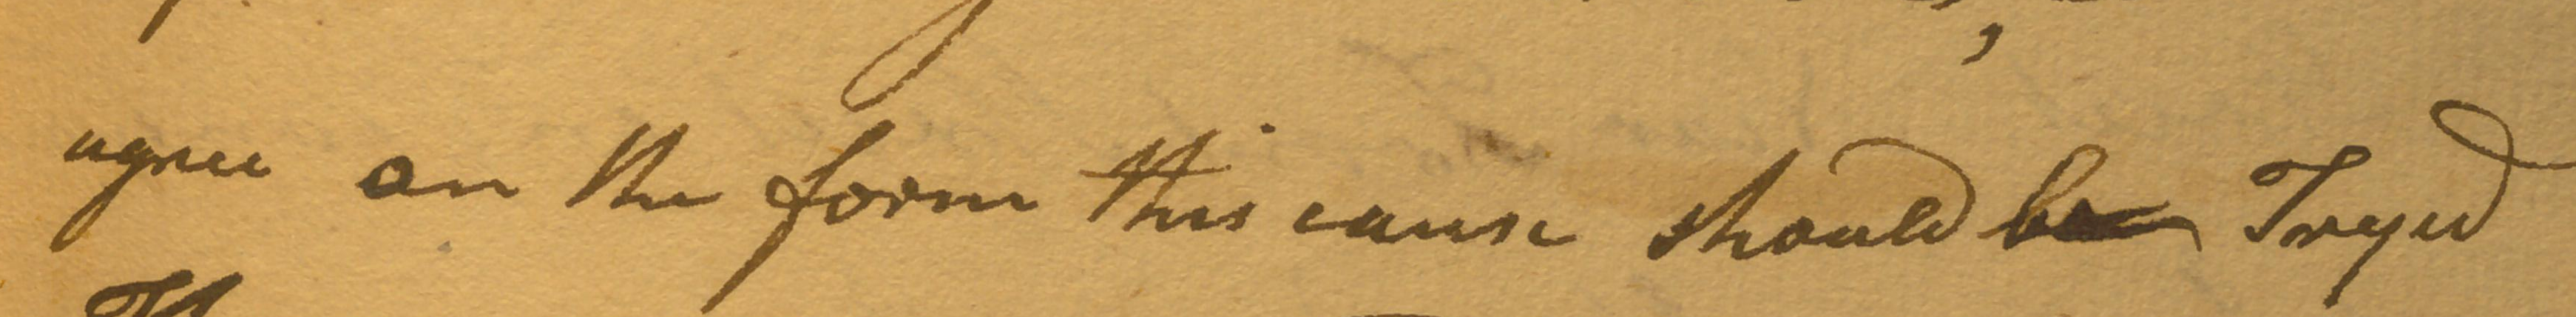agree on the form this cause should [be] Tryed
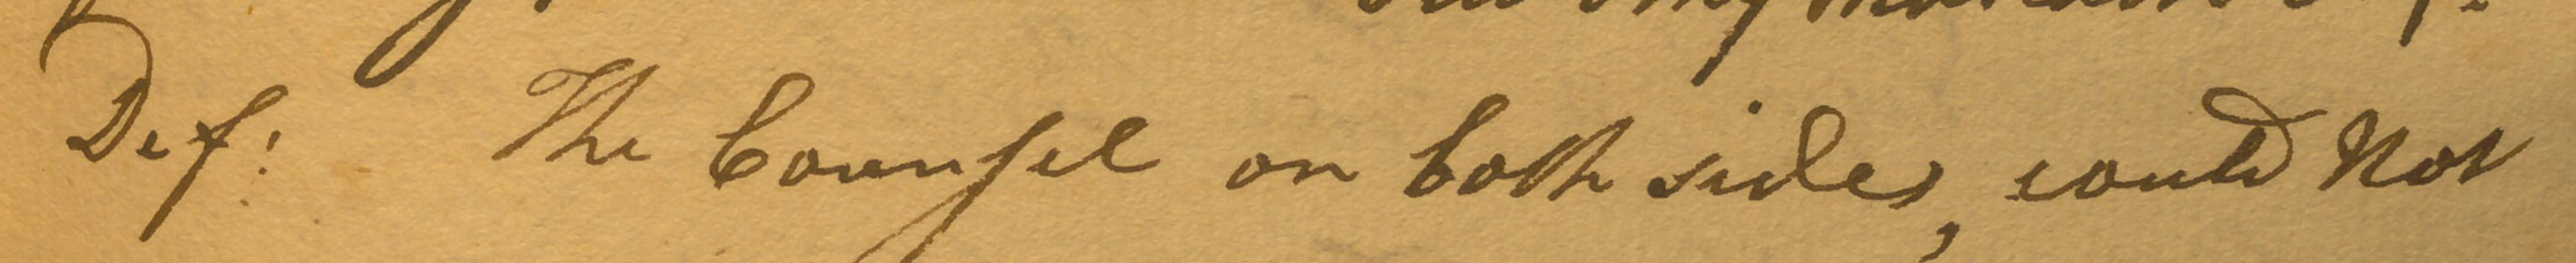Def. The Counsel on both side, could not
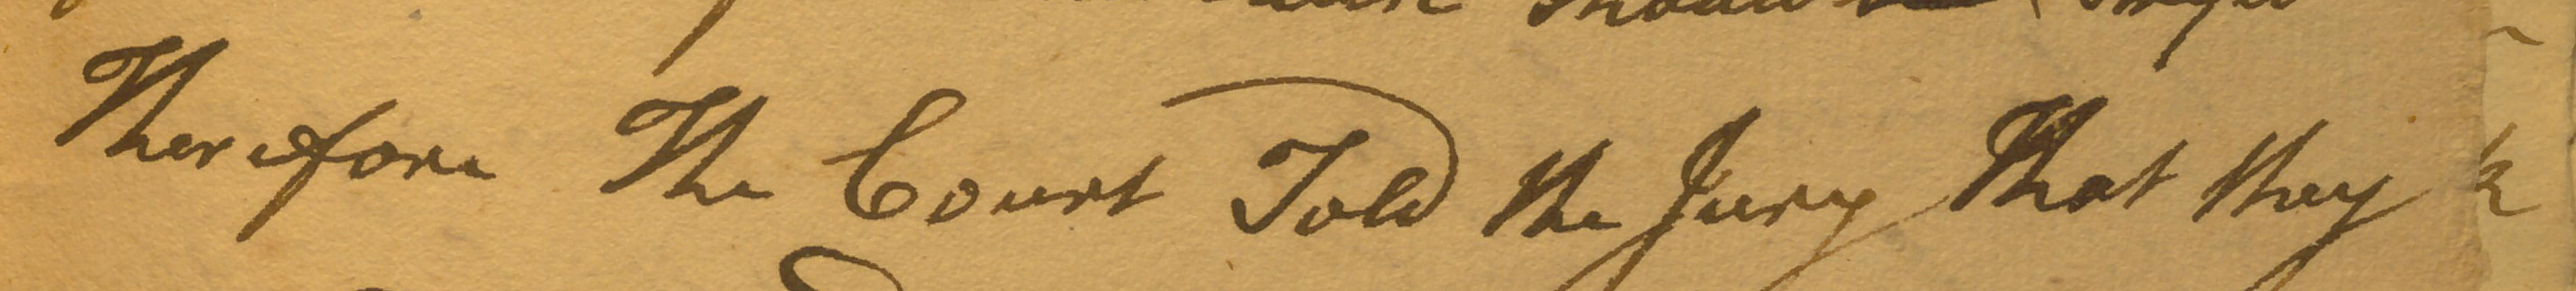Therefore The Court Told the Jury that they
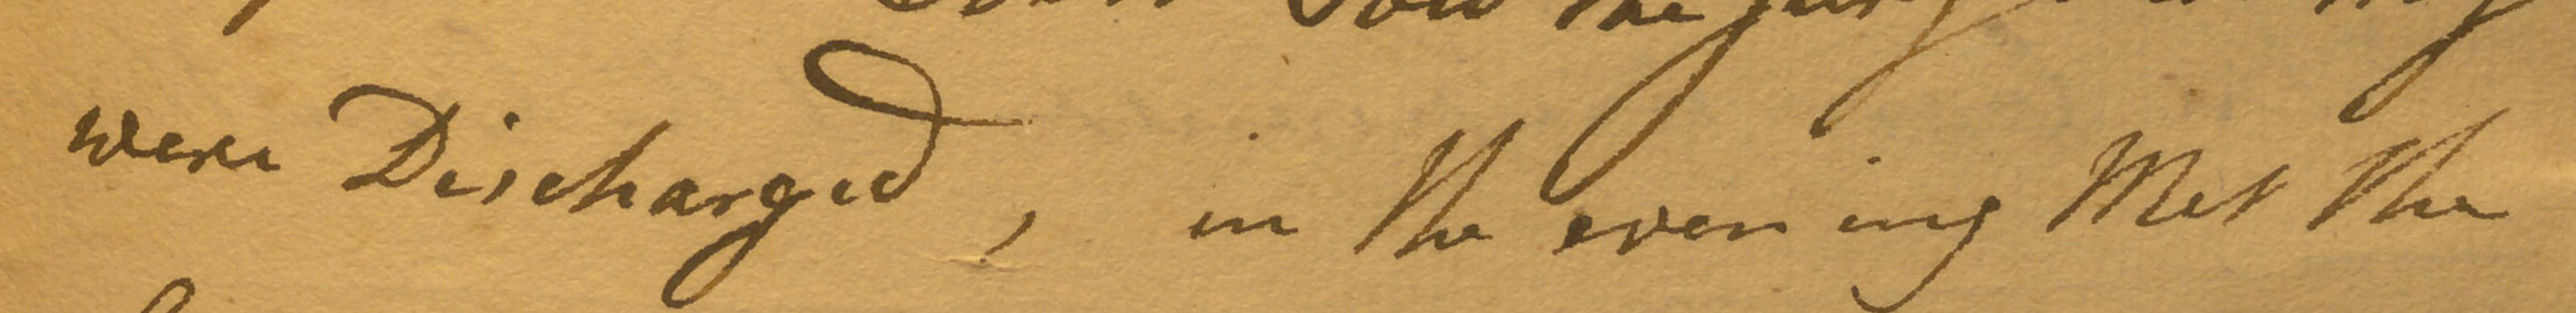were Discharged, in the evening Met the
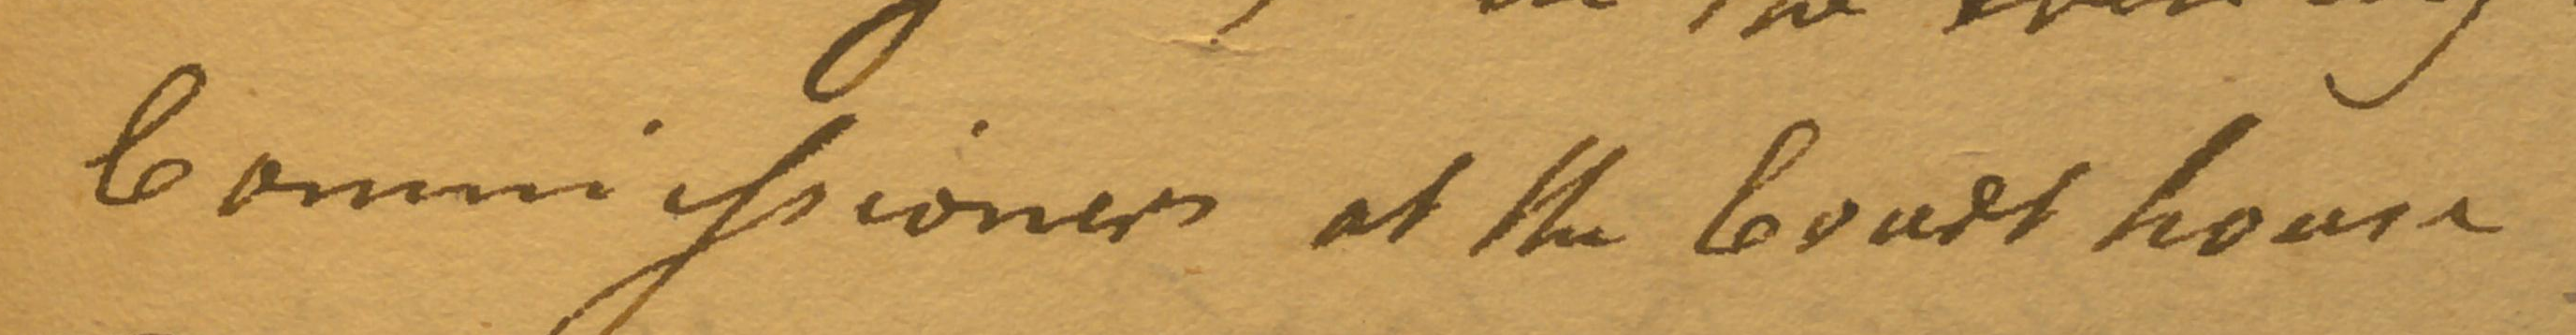Commissioners at the Court house
